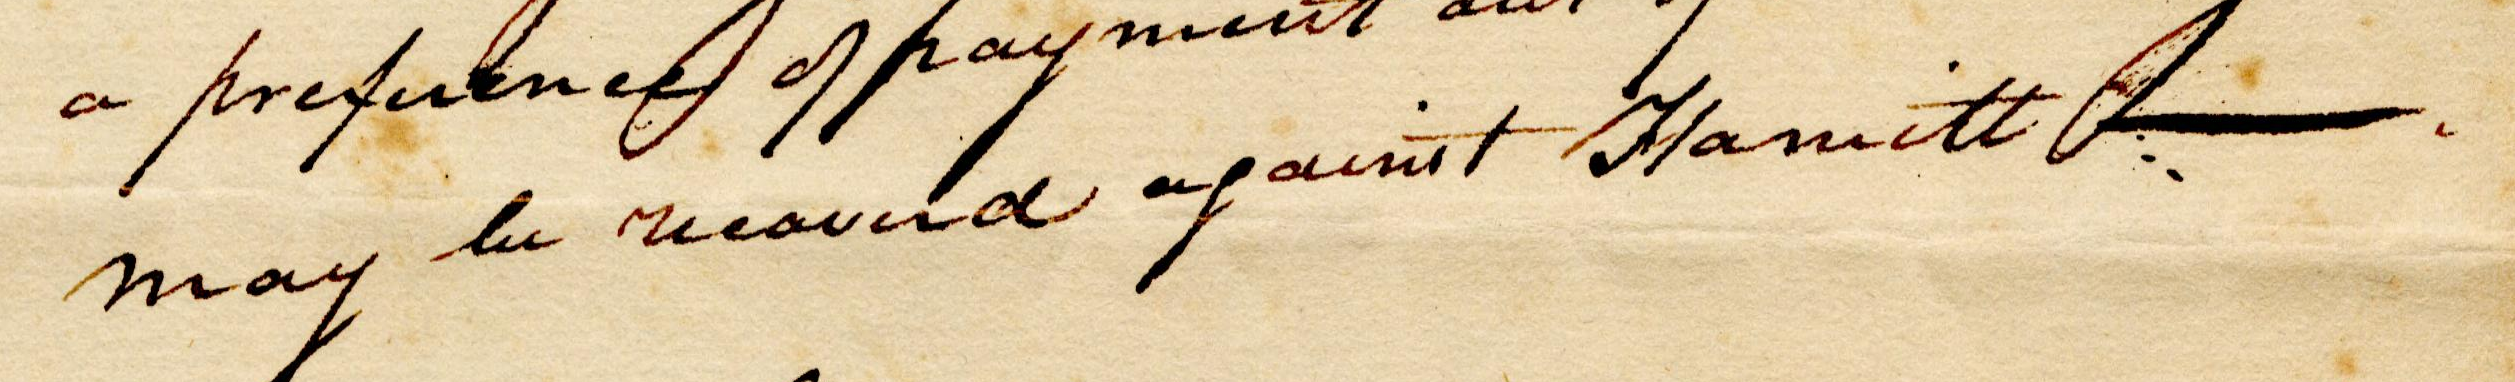may be recoverd against Hamitt.-
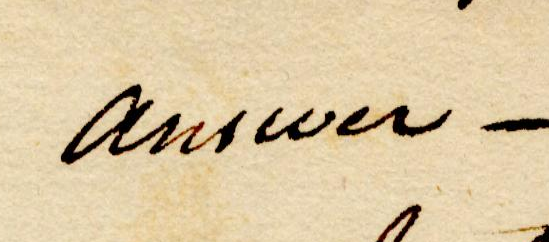Answer-
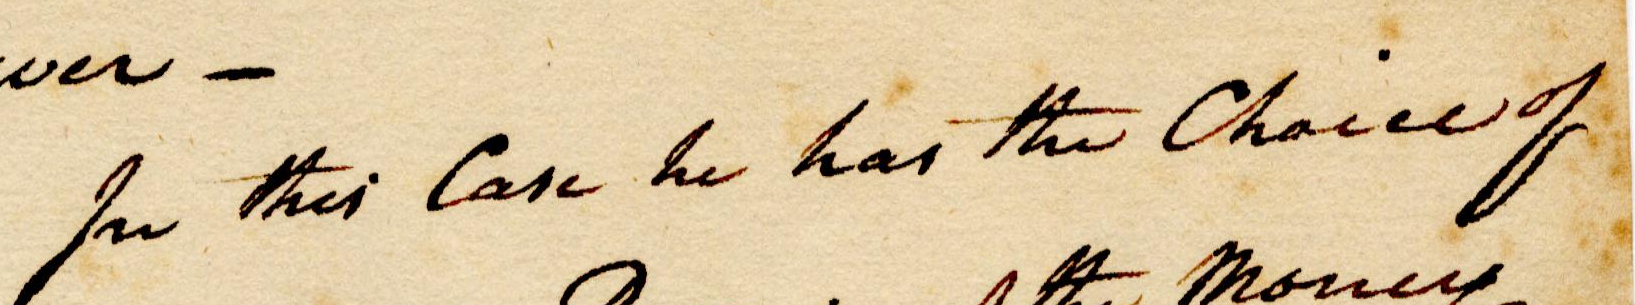In this Case he has the Choice of
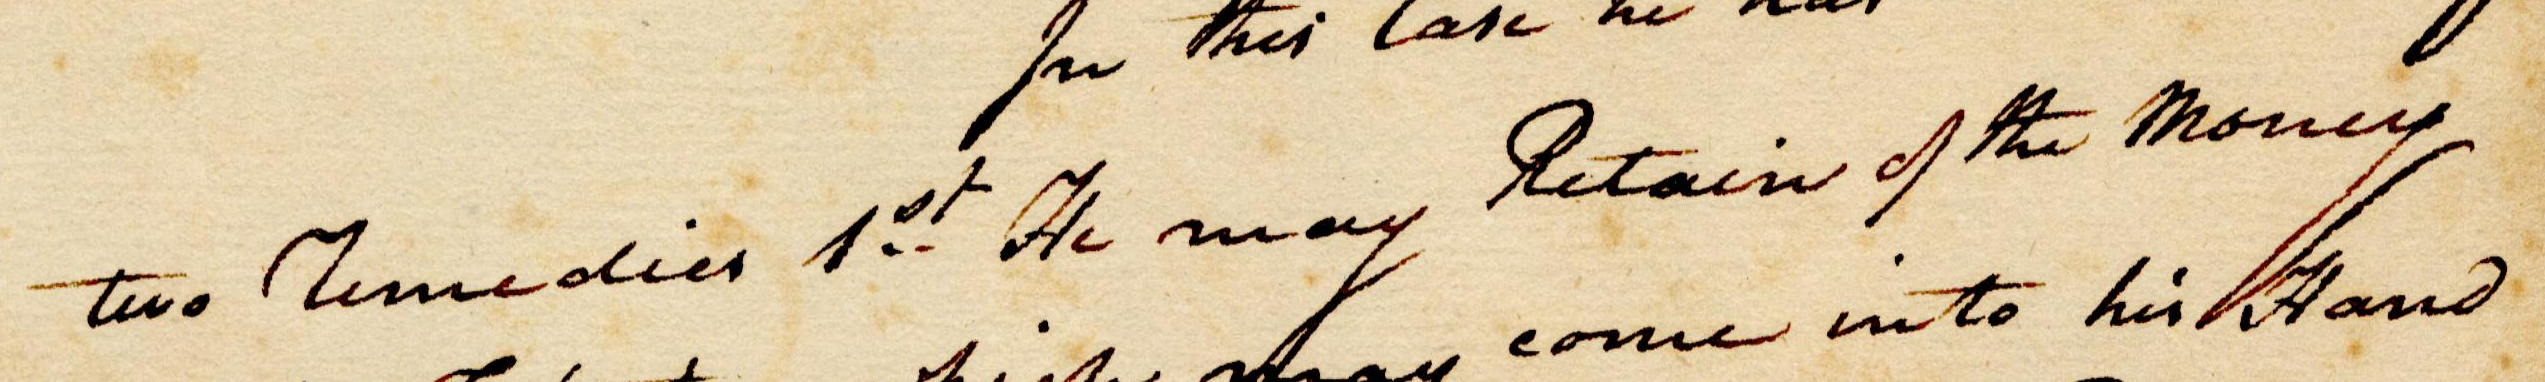two remedies 1^st. He may retain of the money
